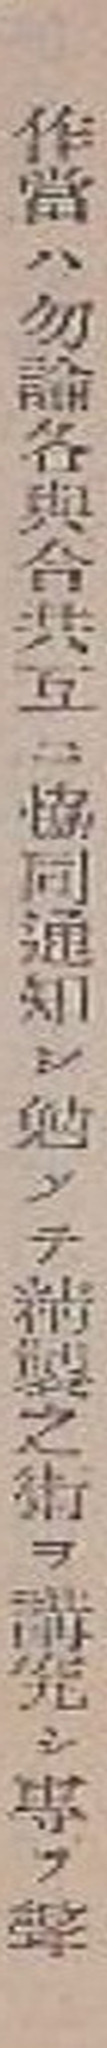作當ハ勿論各與合共互ニ協同通知シ勉メテ精製之術ヲ講究シ専ラ聲
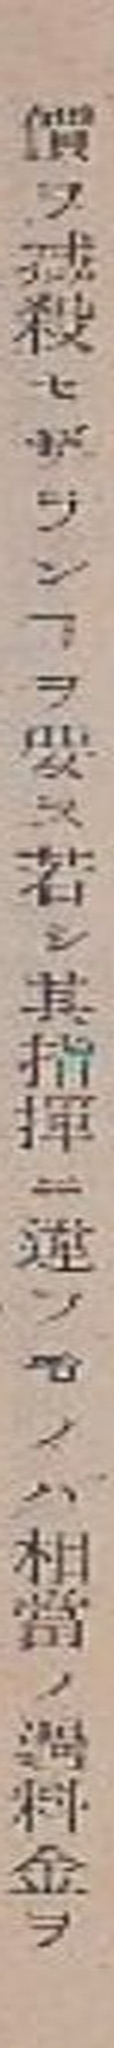價ヲ減殺セザランヿヲ要ス若シ其指揮ニ違フモノハ相當ノ過料金ヲ

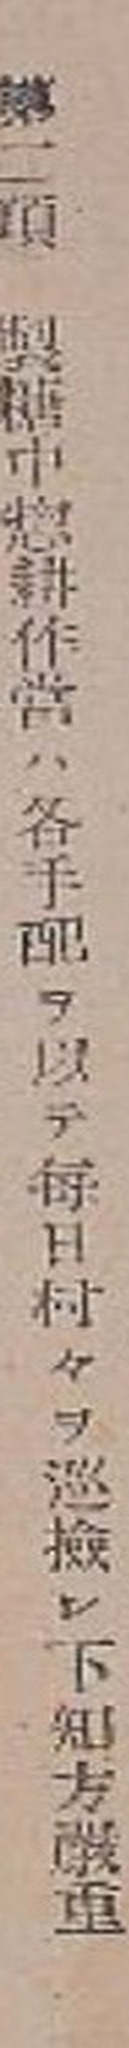第二項製糖中惣耕作當ハ各手配ヲ以テ毎日村々ヲ巡撿シ下知方厳重
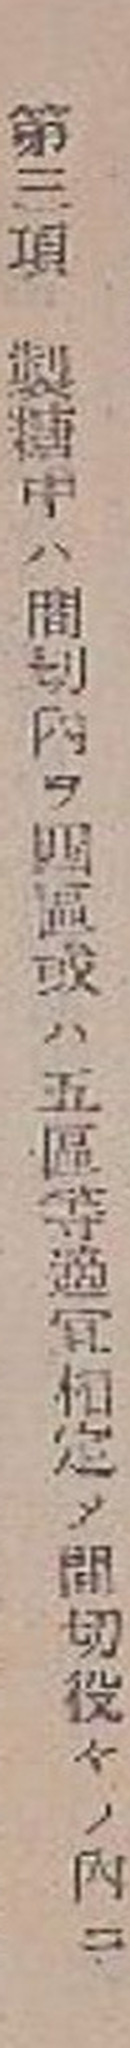第三項製糖中ハ間切内ヲ四區或ハ五區等適宜相定メ間切役々ノ内ニ
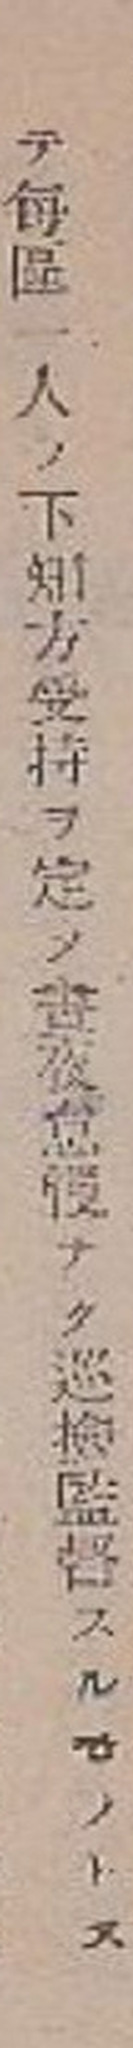テ毎區一人ノ下知方受持ヲ定メ晝夜怠慢ナク巡撿監督スルモノトス
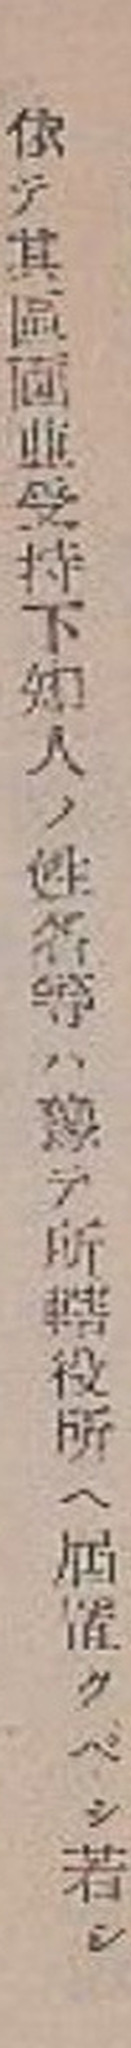依テ其區画並受持下知人ノ姓名等ハ豫テ所轄役所ヘ届置クベシ若シ
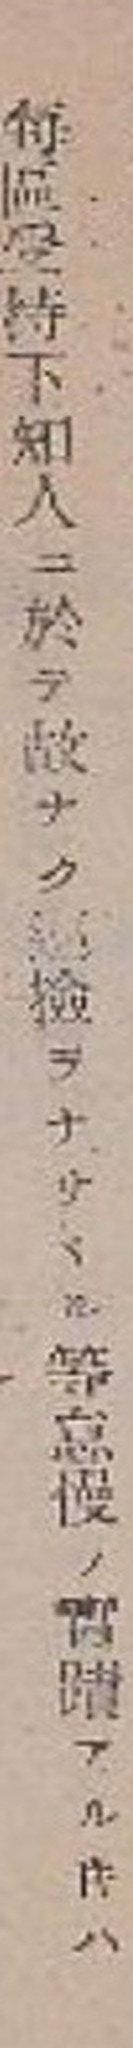毎區受持下知人ニ於テ故ナク巡撿ヲナサヾル等怠慢ノ實蹟アルトキハ
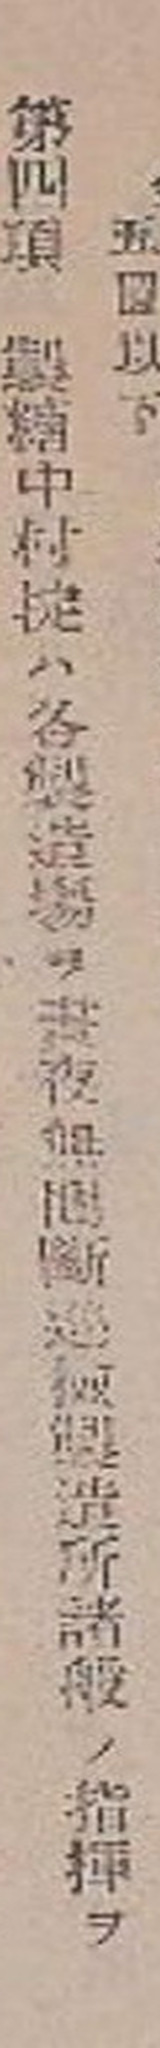第四項製糖中村掟ハ各製造場ヲ昼夜無間断巡撿製造所諸般ノ指揮ヲ
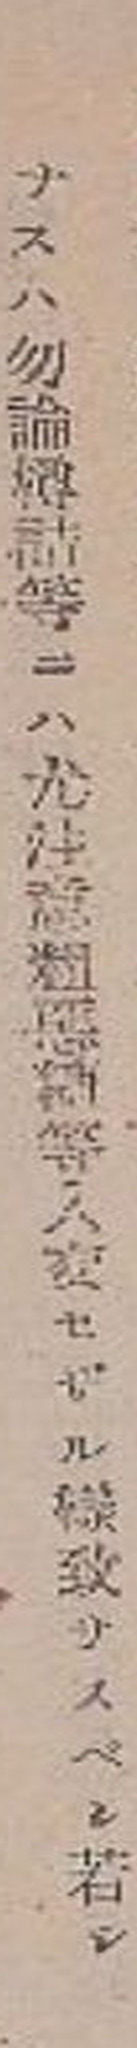ナスハ勿論樽詰等ニハ尤注意粗悪糖等入交セザル様致サスベシ若シ
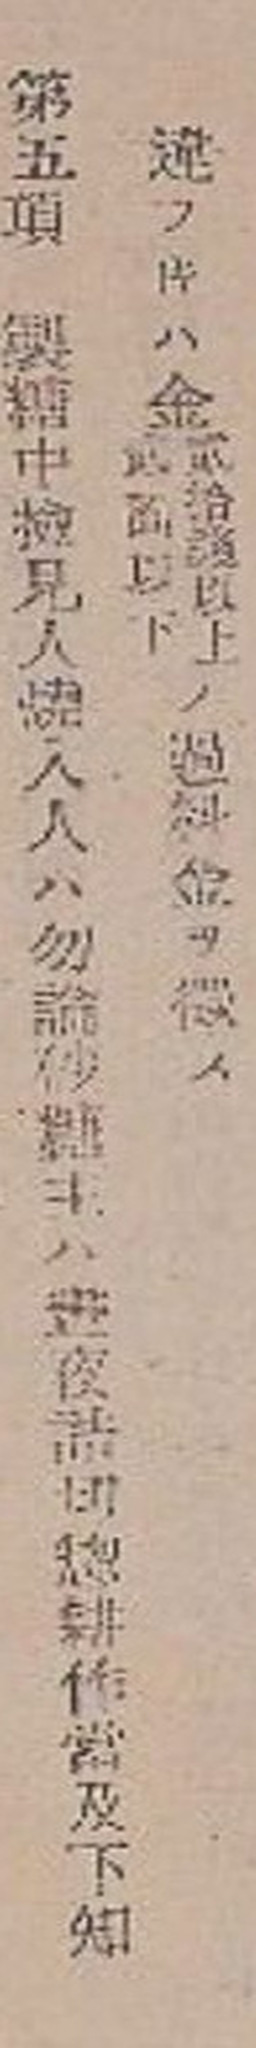第五項製糖中撿見人焼入人ハ勿論砂糖主ハ昼夜詰切惣耕作當及下知
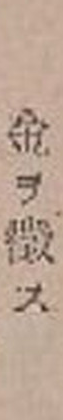金ヲ徴ス
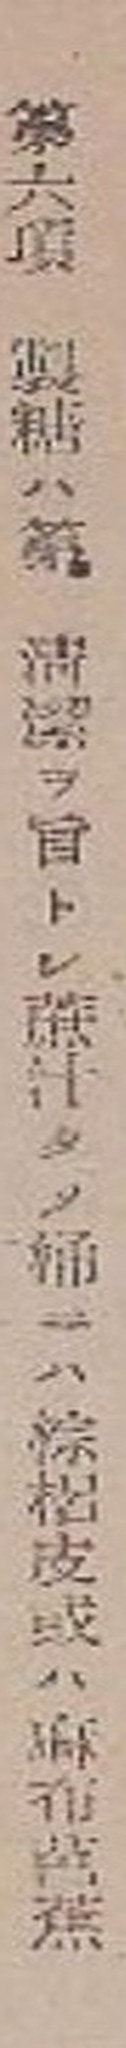第六項製糖ハ第清潔ヲ旨トシ蔗汁タメ桶ニハ棕梠皮或ハ麻布芭蕉
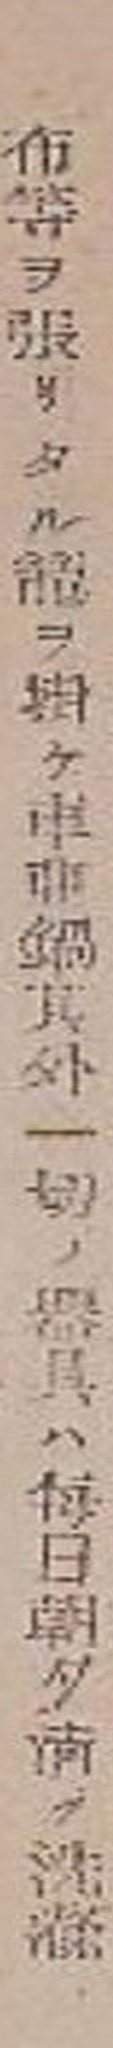布等ヲ張リタル籠ヲ掛ケ車並鍋其外一切ノ器具ハ毎日朝夕清ク洗浄
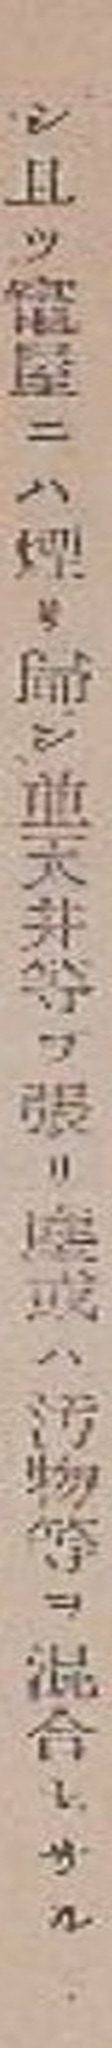シ且ツ竈屋ニハ煙リ帰シ並天井等ヲ張リ塵或ハ汚物等ヲ混合セサル
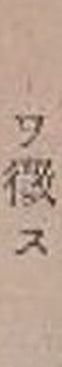ヲ徴ス
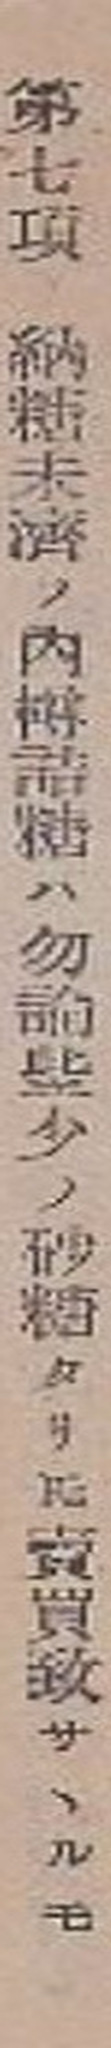第七項納糖未済ノ内樽詰糖ハ勿論些少ノ砂糖タリトモ売買致サヽルモ
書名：製糖取締旧慣内法
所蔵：University of the Ryukyus Library
